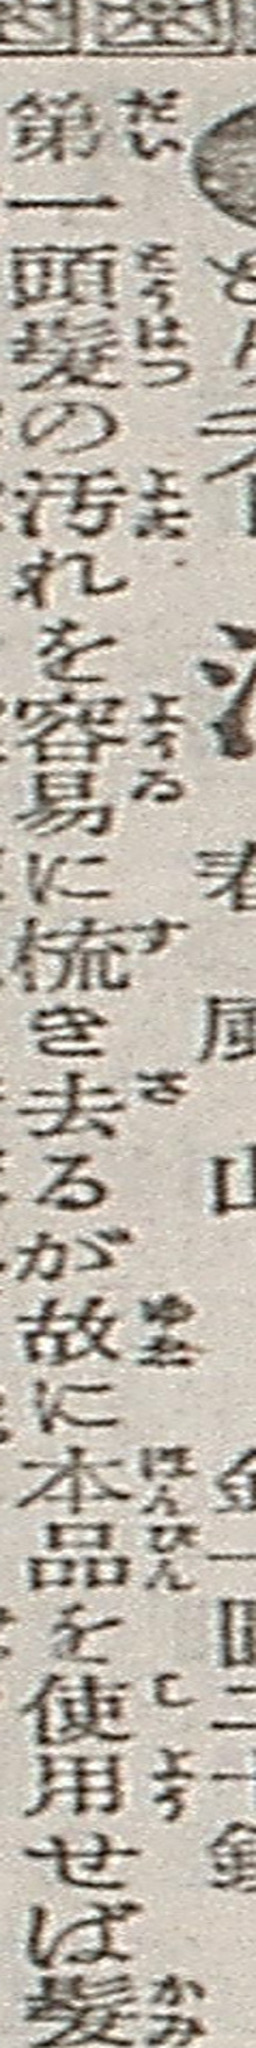第一頭髪の汚れを容易に梳き去るが故に本品を使用せば髪
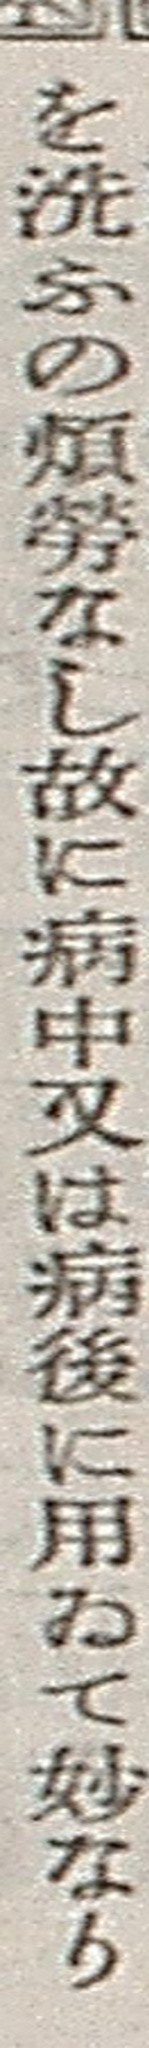を洗ふの煩労なし故に病中又は病後に用ゐて妙なり
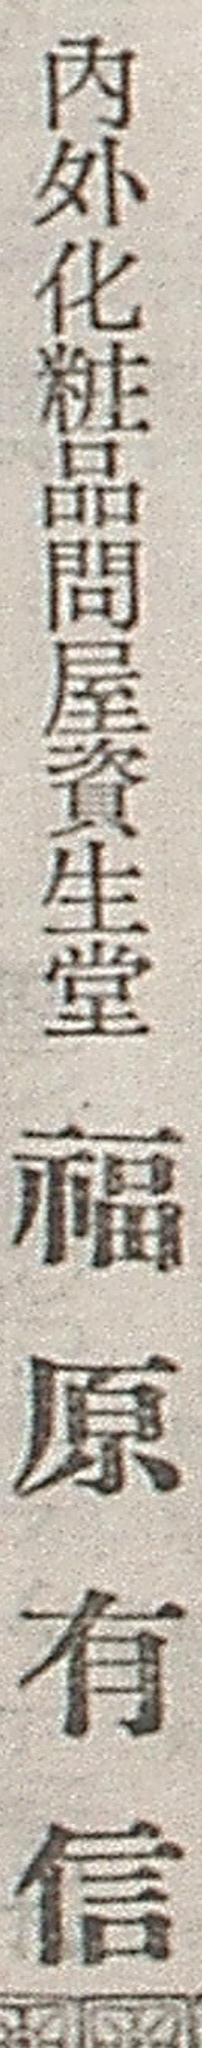内外化粧品問屋資生堂福原有信

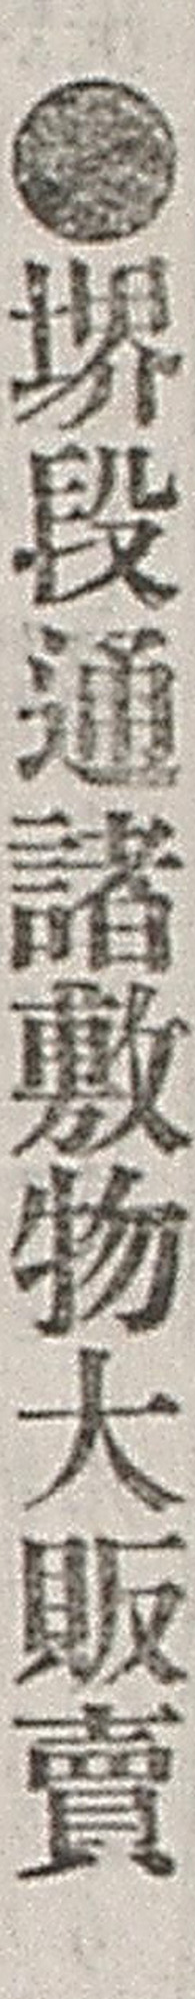●堺段通諸敷物大販売
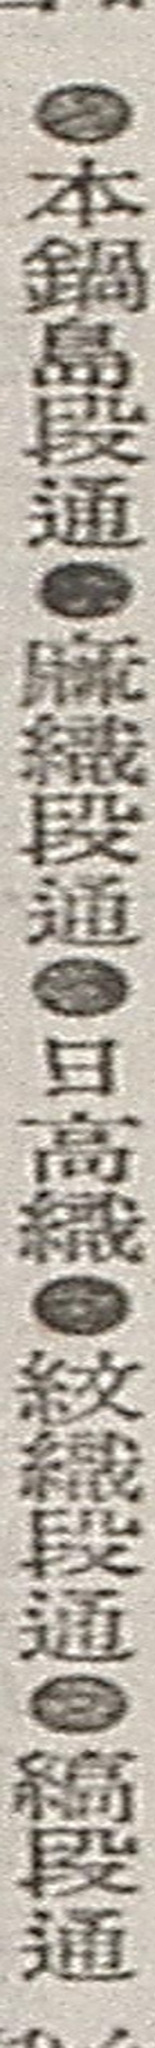●本鍋島段通●麻織段通●日高織●紋織段通●縞段通
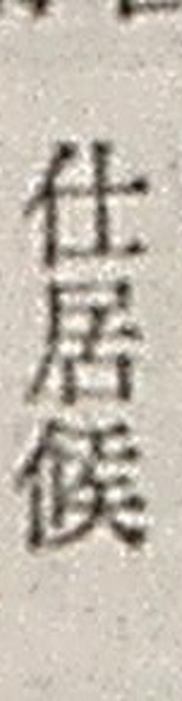仕居候
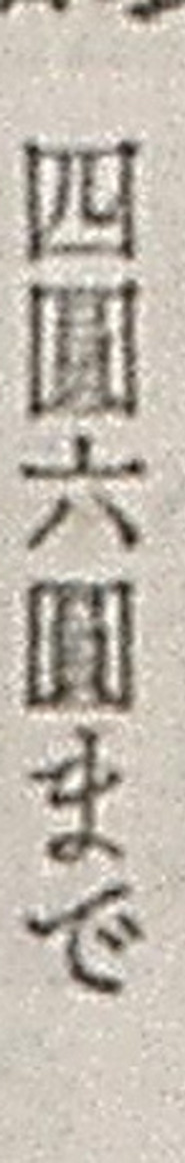四円六円まで
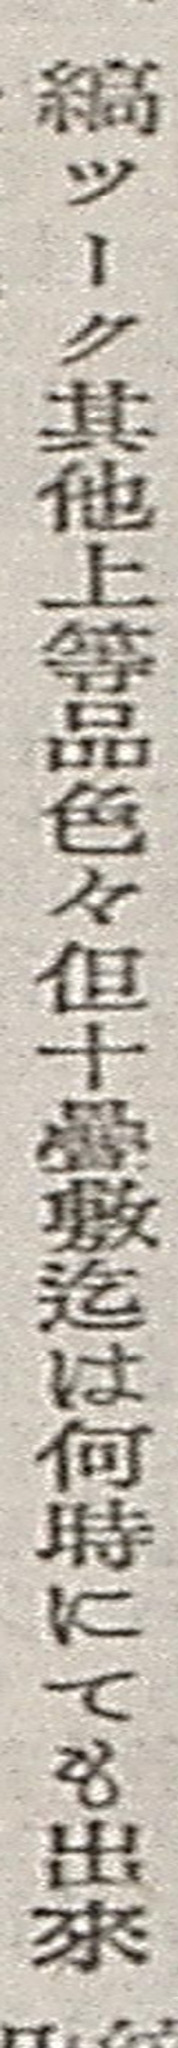縞ツーク其他上等品色々但十畳敷迄は何時にても出来
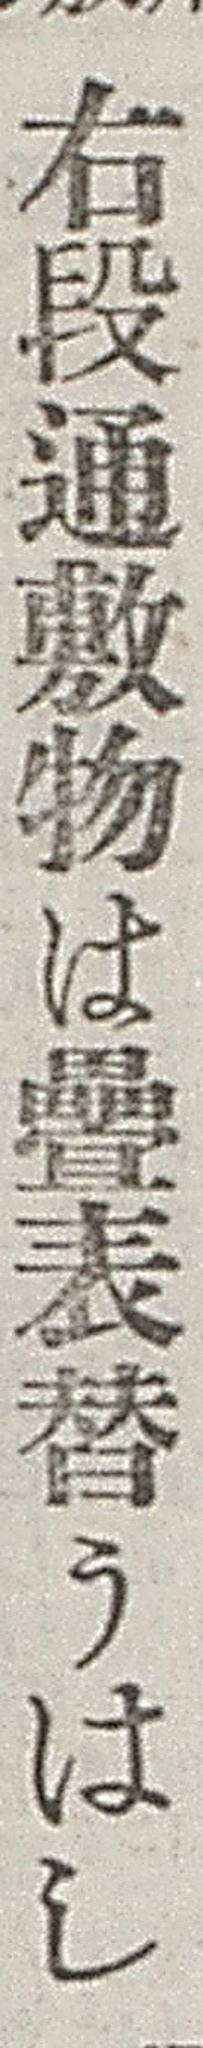右段通敷物は畳表替うはし
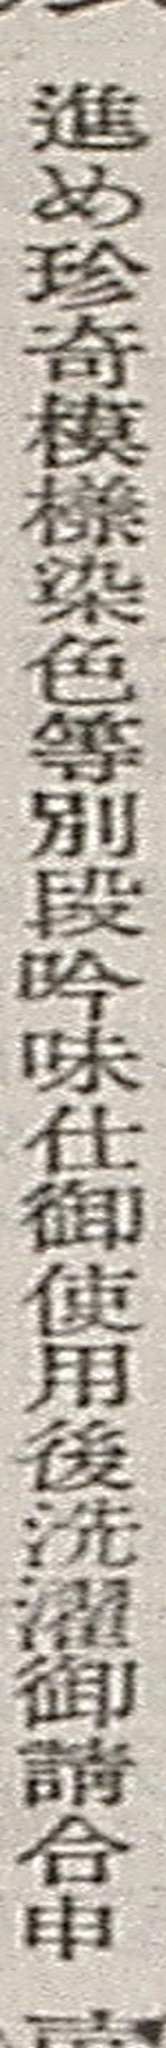進め珍奇模様染色等別段吟味仕御使用後洗濯御請合申
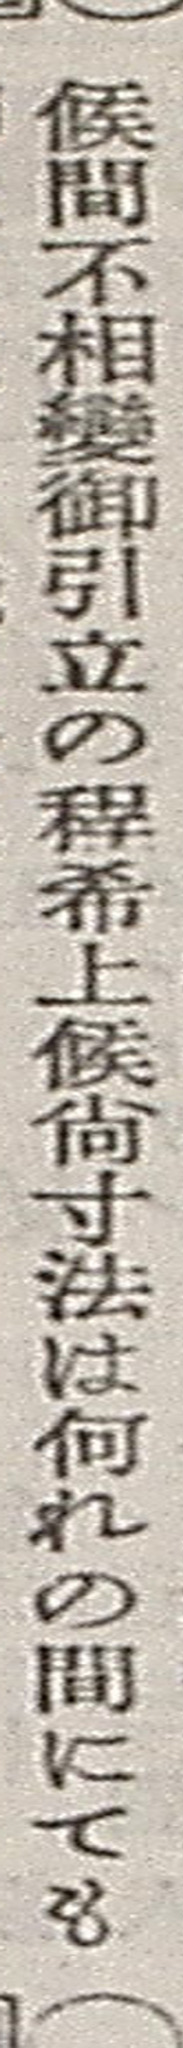候間不相変御引立の程希上候尚寸法は何れの間にても
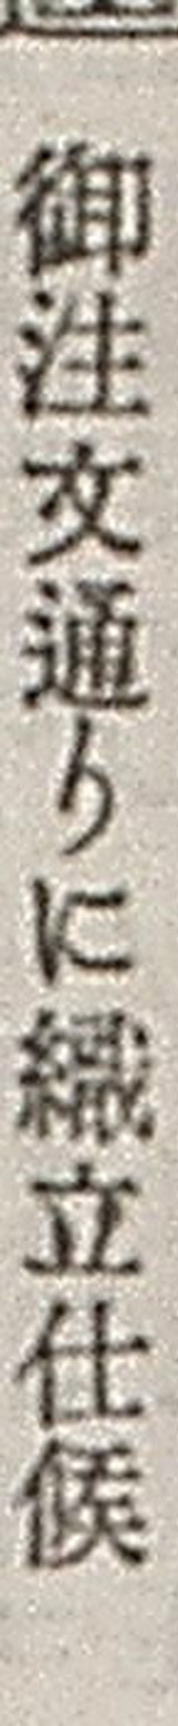御注文通りに織立仕候
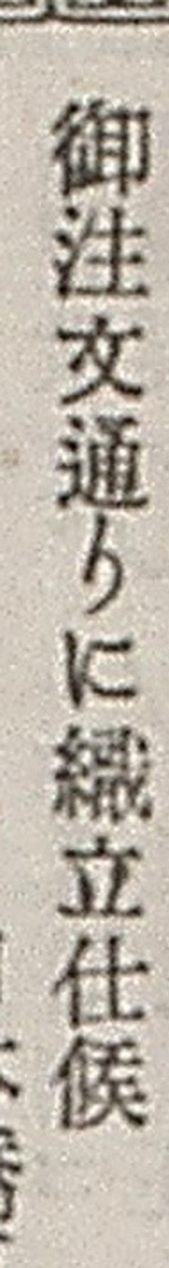御注文通りに織立仕候
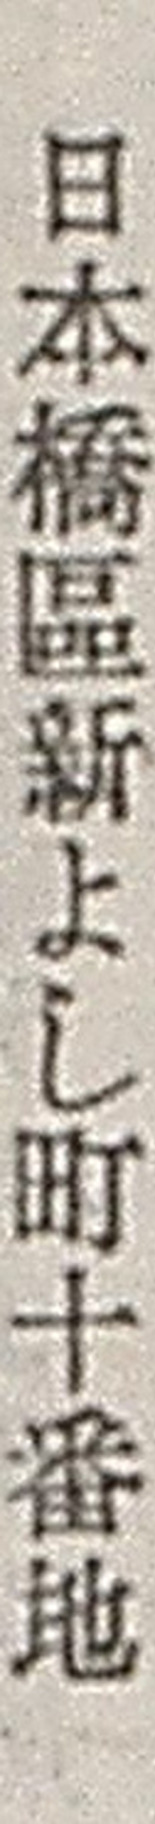日本橋区新よし町十番地
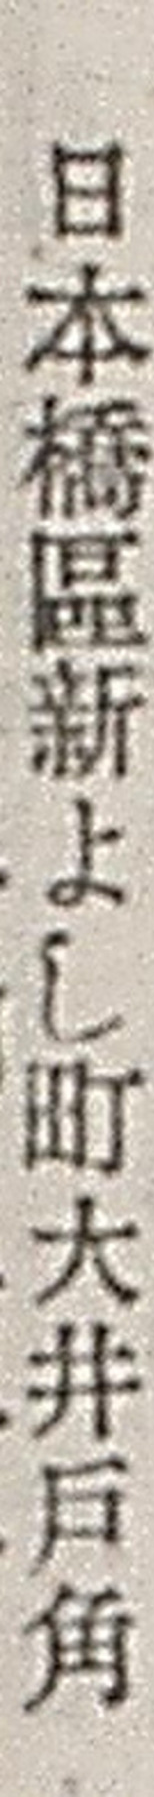日本橋区新よし町大井戸角
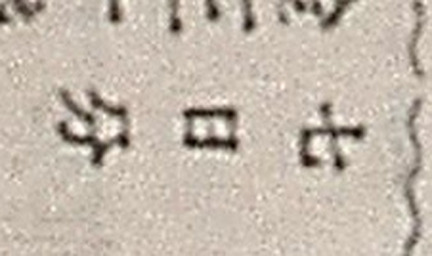七日分
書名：風俗畫報臨時増刊第百九十九號　明治三十二年十月各地災害圖會（前編之續）
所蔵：東京大学地震研究所図書室 Earthquake Research Institute Library, The University of Tokyo, JAPAN
